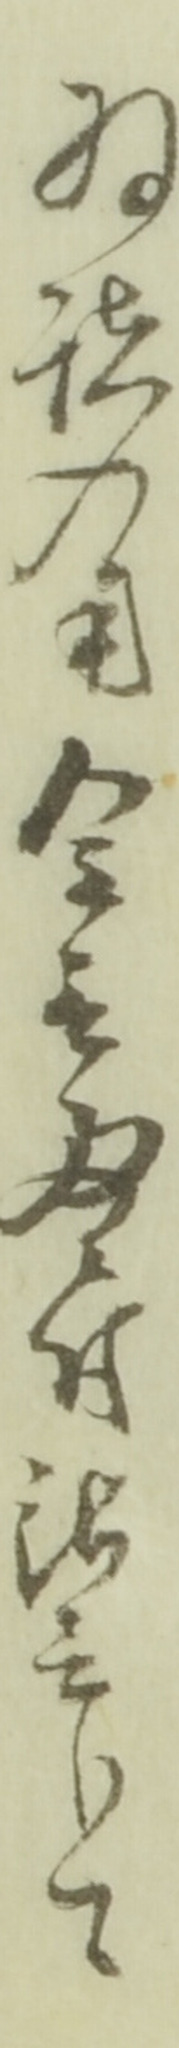為諸入用金壱両二付銀壱百文て
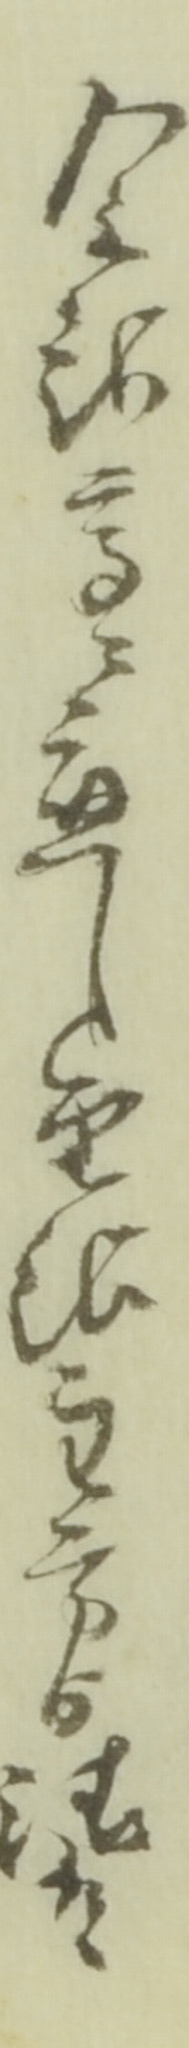金銀高二応し金銀主方より
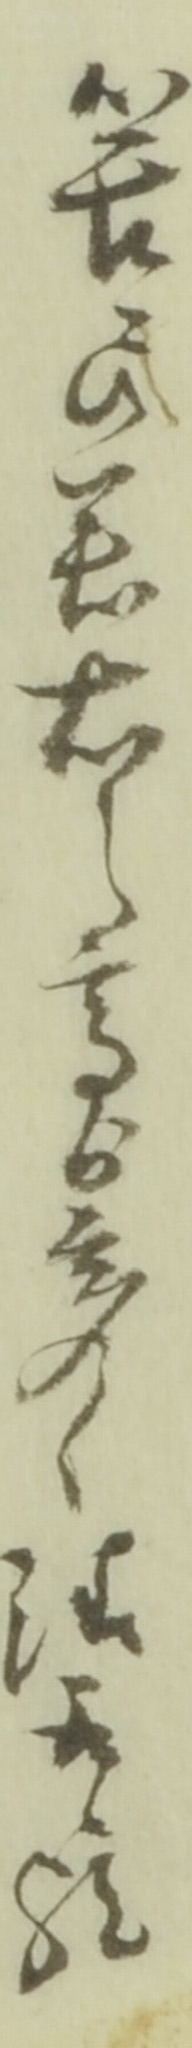筈二候若右之高より多く請取候猶
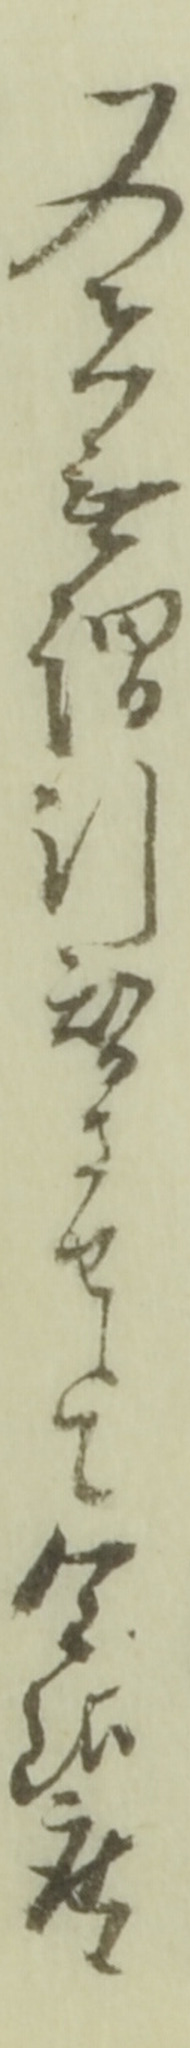又者無謂われ引替さセ候て金銀座二
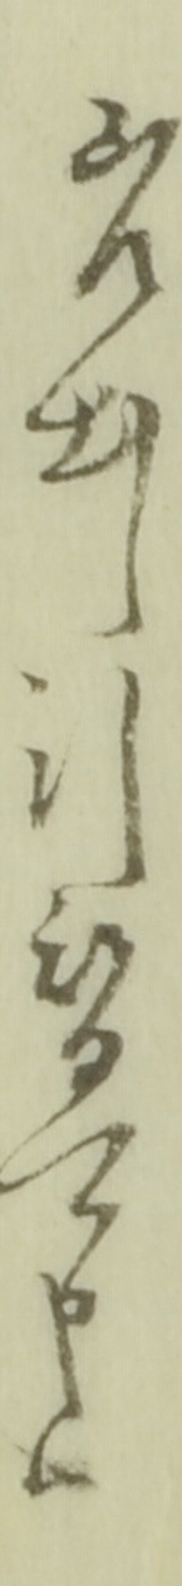差出候引替可申候
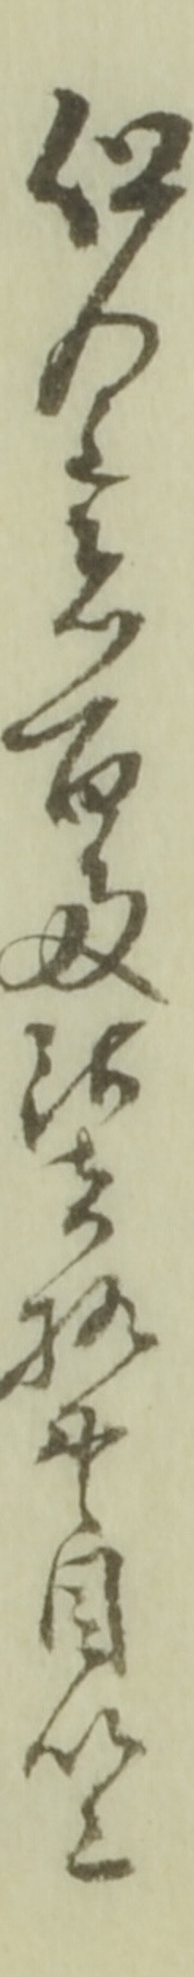但金銀百両銀者九十目以上
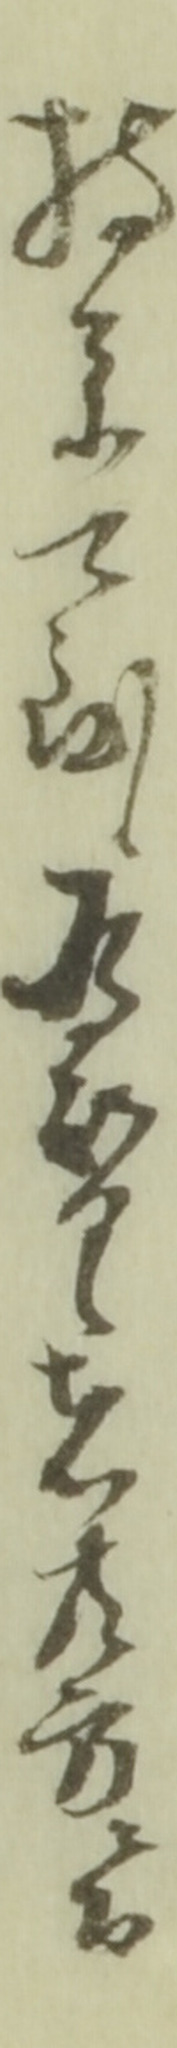持参可致候取替候者共方二而
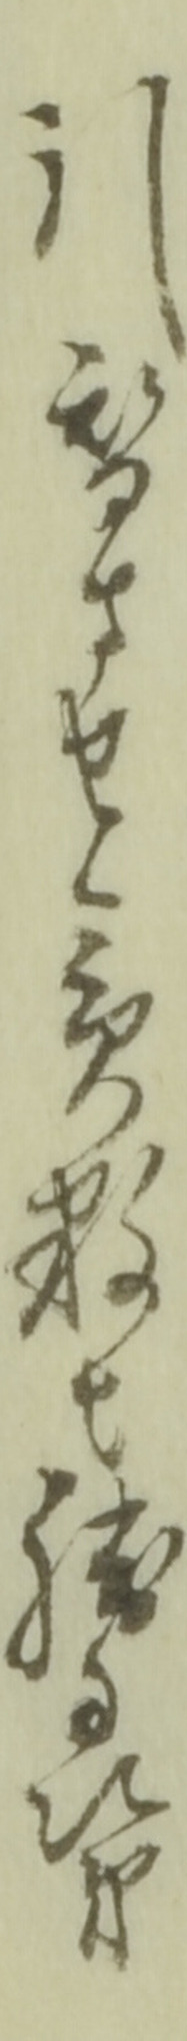引替さセて員数者勝手次第
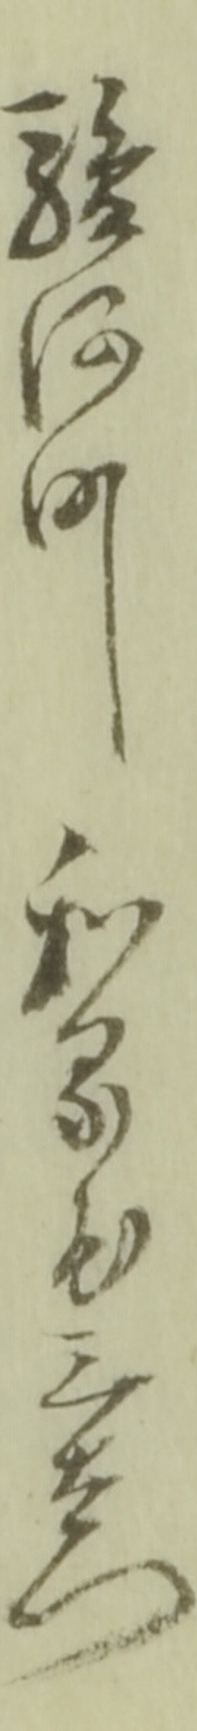駿河町和家長三右衛門
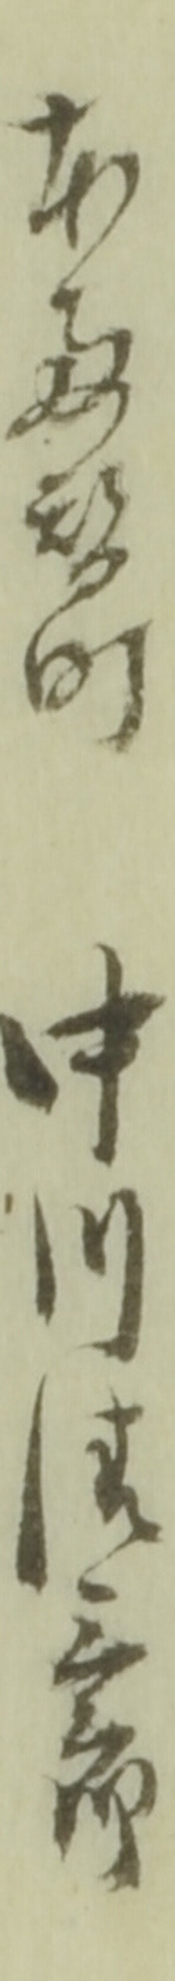本両替町中川清三郎
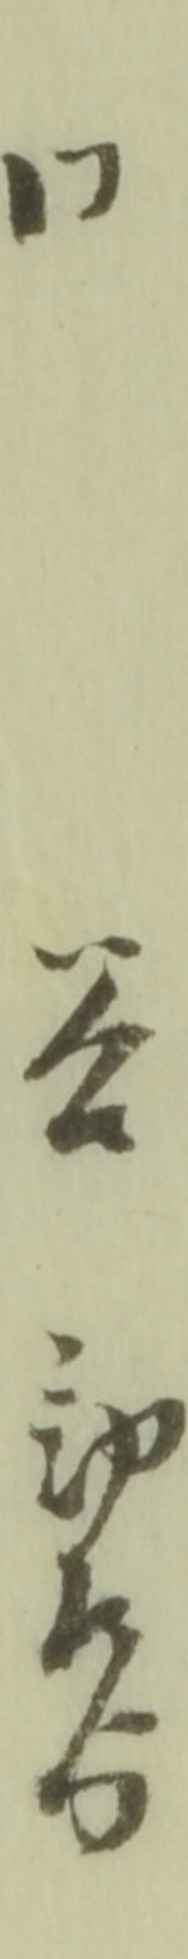同谷勘左衛門
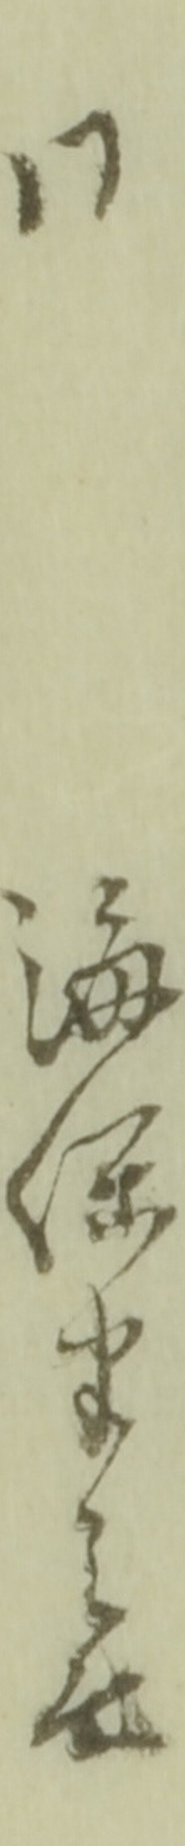同海保三之介
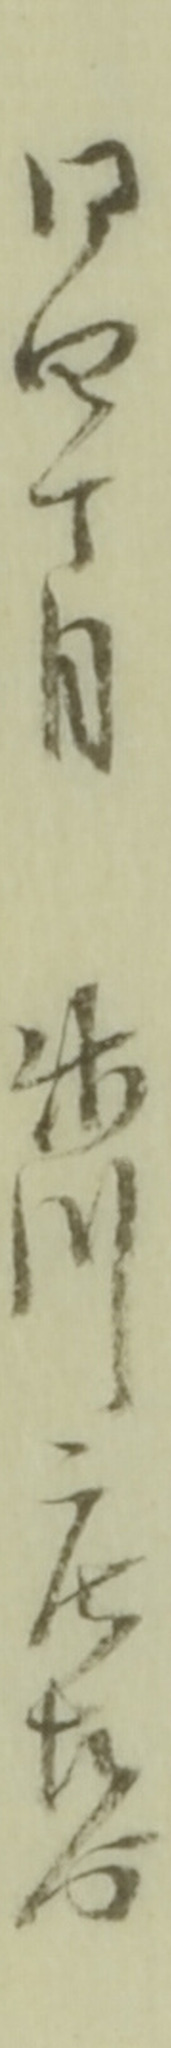同四丁目竹川庄左衛門
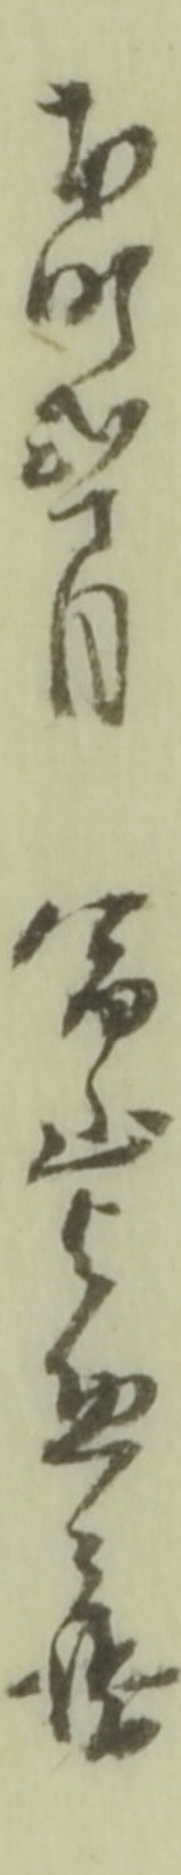本町弐丁目冨山与惣兵衛
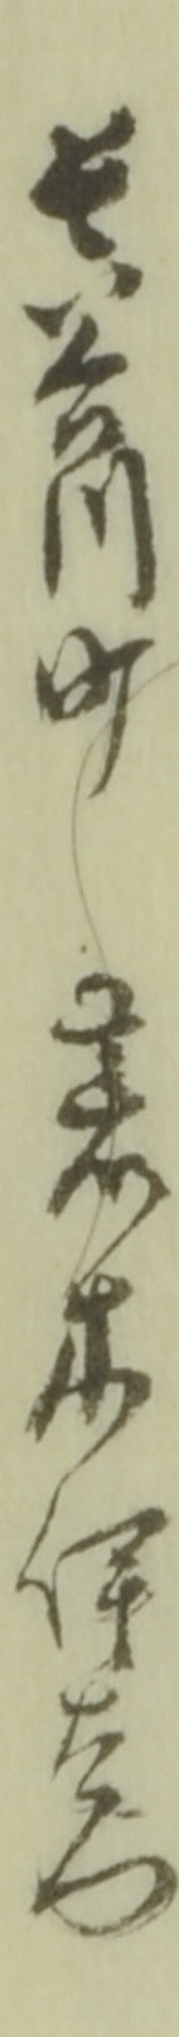長谷川町木伊右衛門
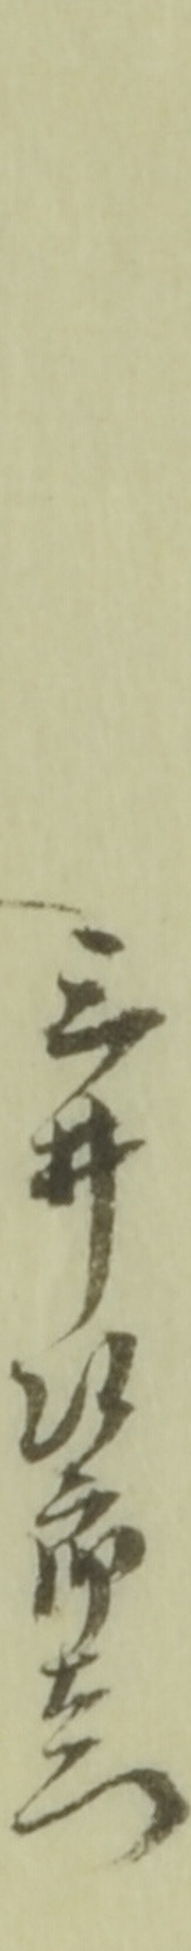三井次郎右衛門
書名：御公儀様御領主様御触書控
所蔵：伊那市立高遠町図書館・合同会社AMANE
